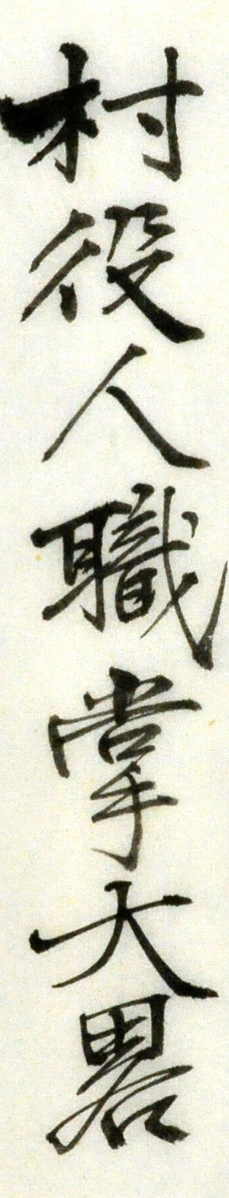村役人職掌大略

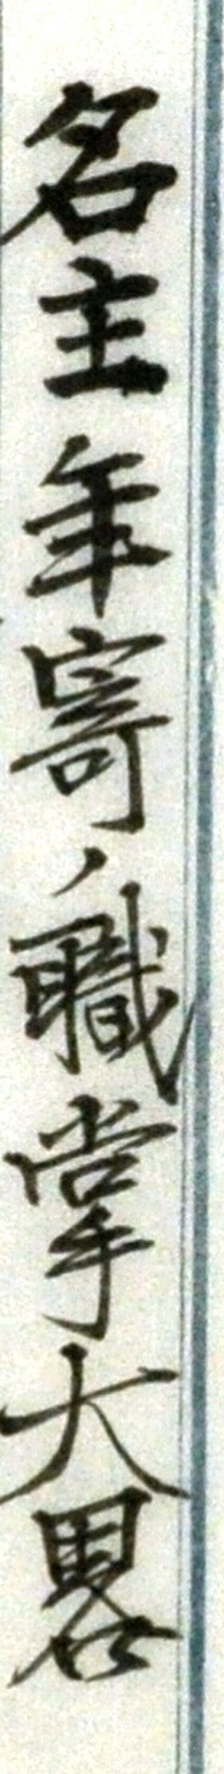名主年寄ノ職掌大略
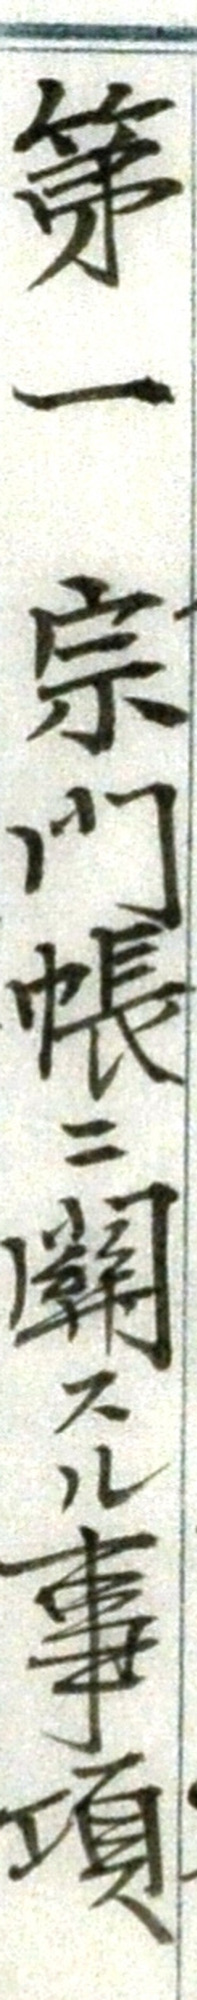第一宗門帳ニ関スル事項
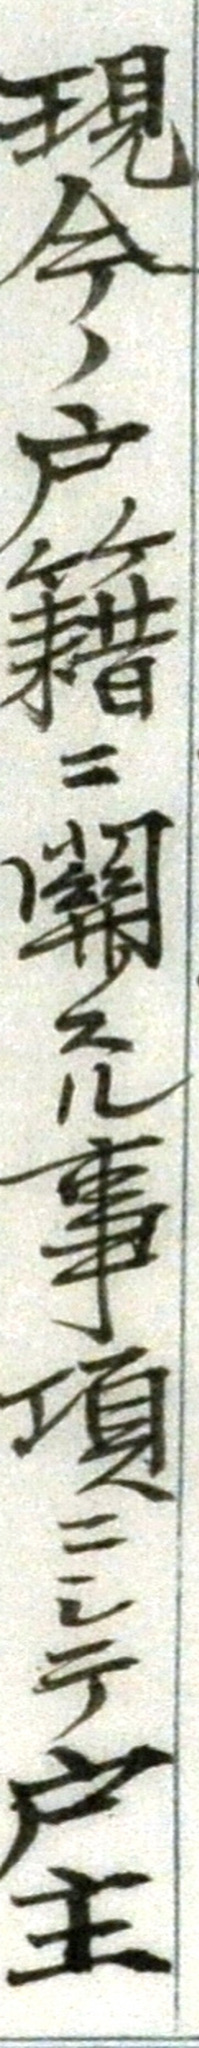現今ノ戸籍ニ関スル事項ニシテ戸主
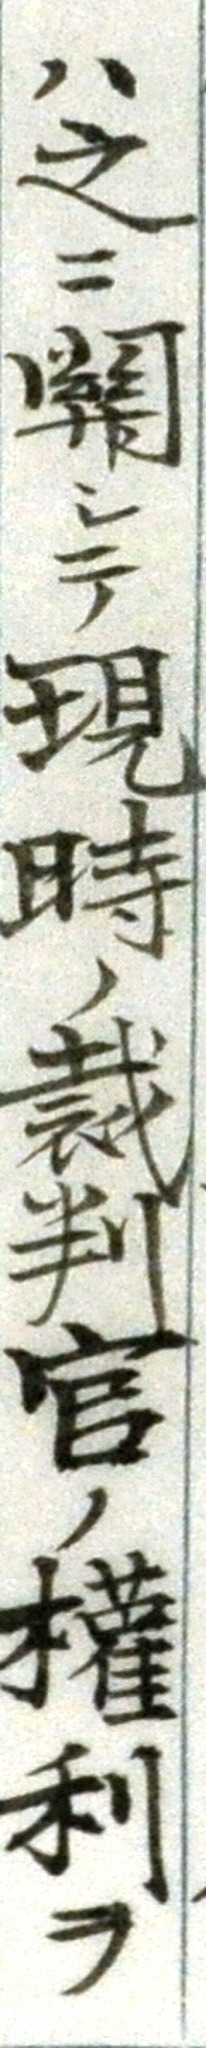ハ之ニ関シテ現時ノ裁判官ノ権利ヲ
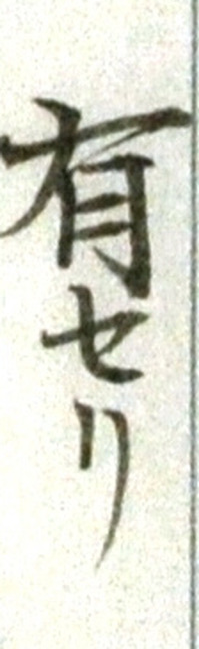有セリ
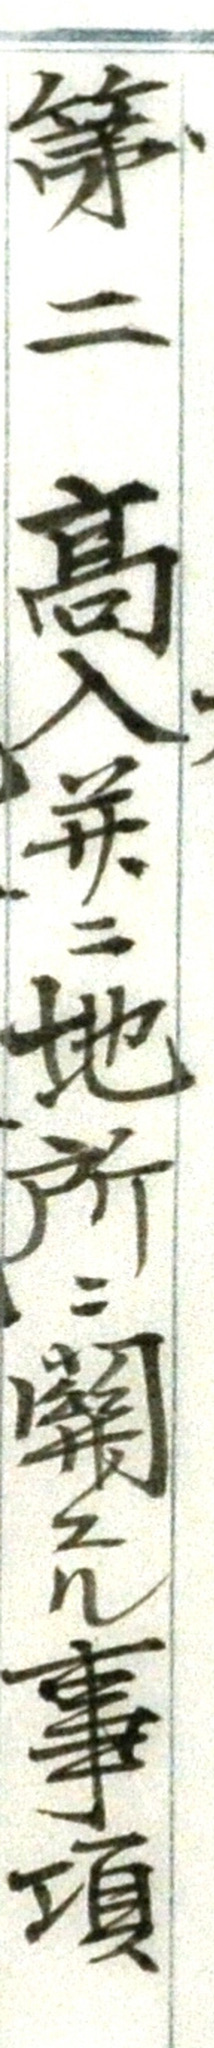第二高入幷ニ地所ニ関スル事項
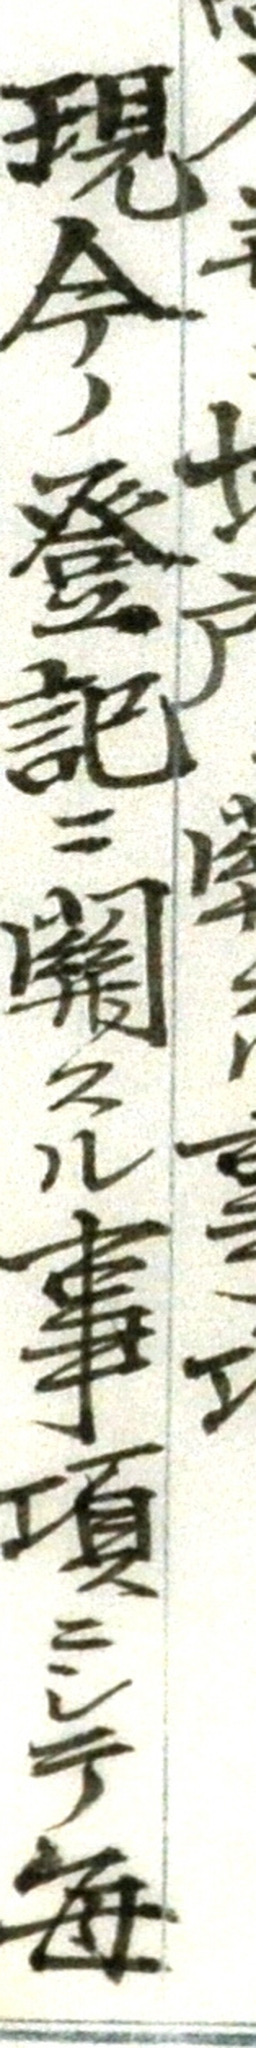現今ノ登記ニ関スル事項ニシテ毎
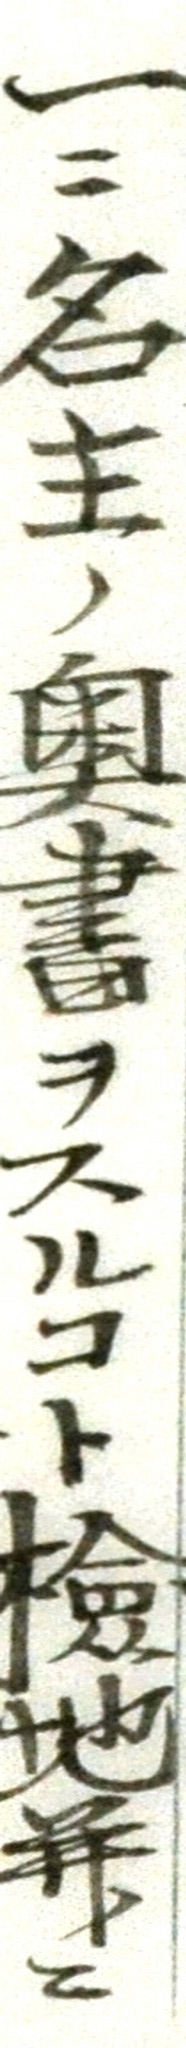一ニ名主ノ奥書ヲスルコト検地幷ニ
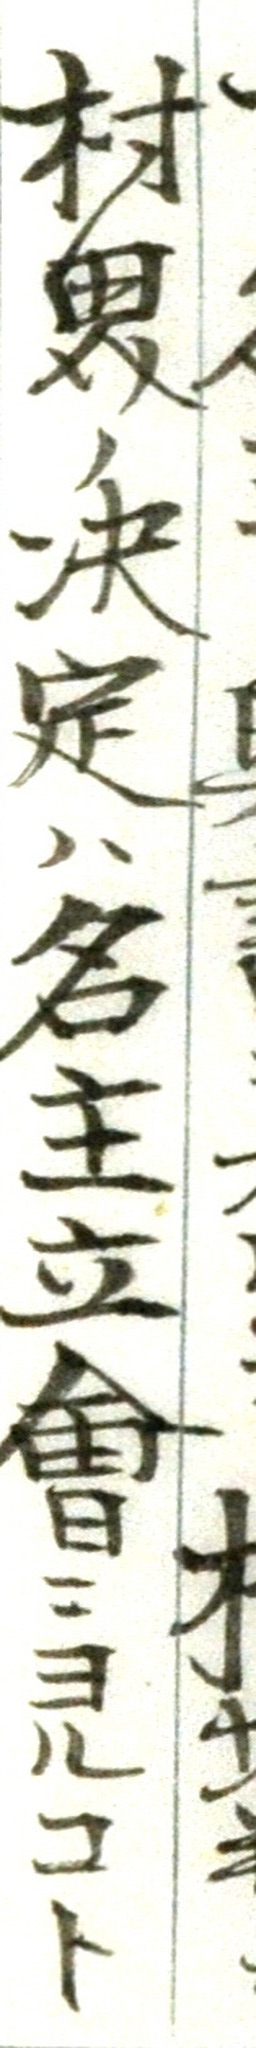村界ノ決定ハ名主立会ニヨルコト

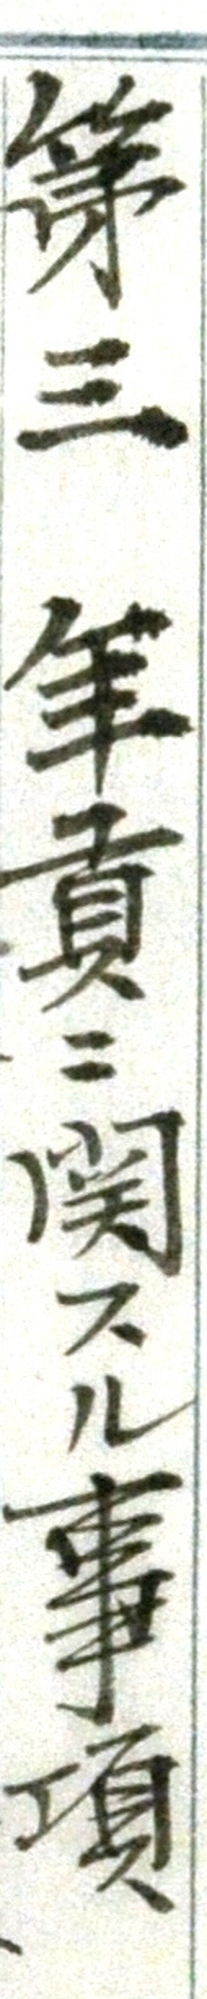第三年貢ニ関スル事
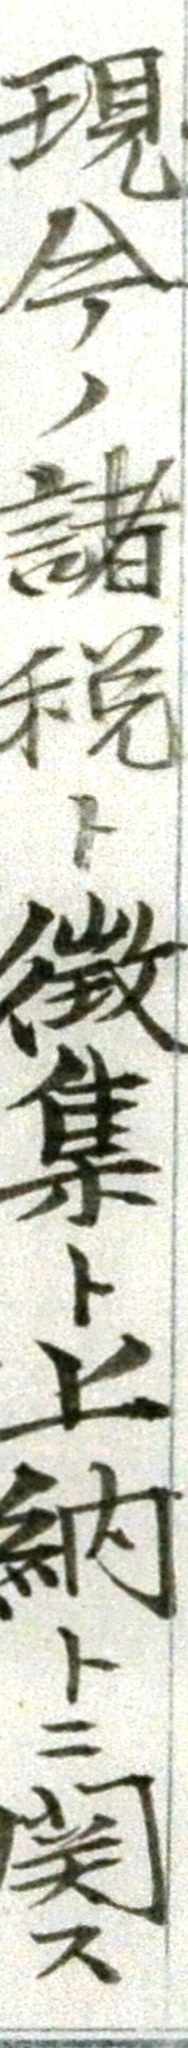現今ノ諸税ト徴集ト上納トニ関ス
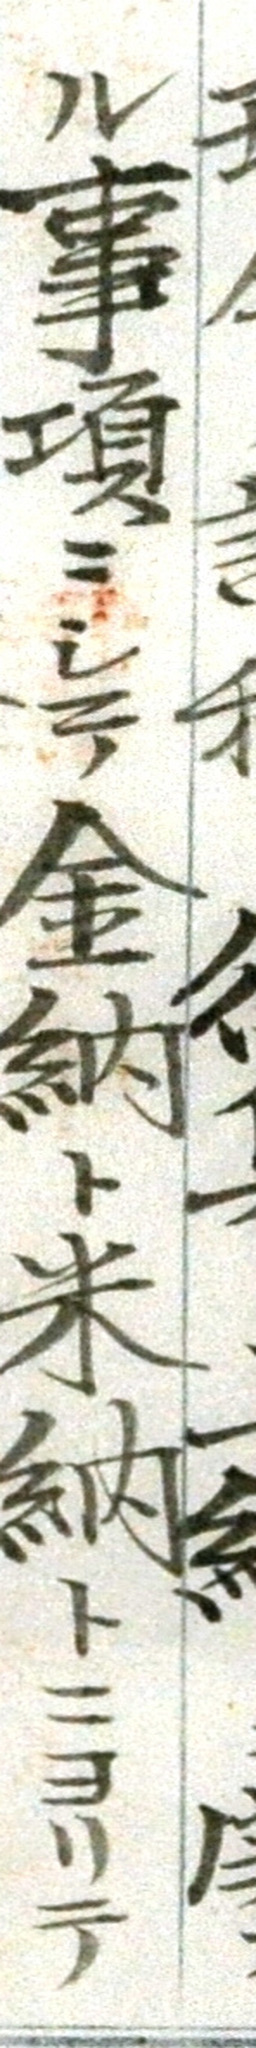ル事項ニシテ金納ト米納トニヨリテ
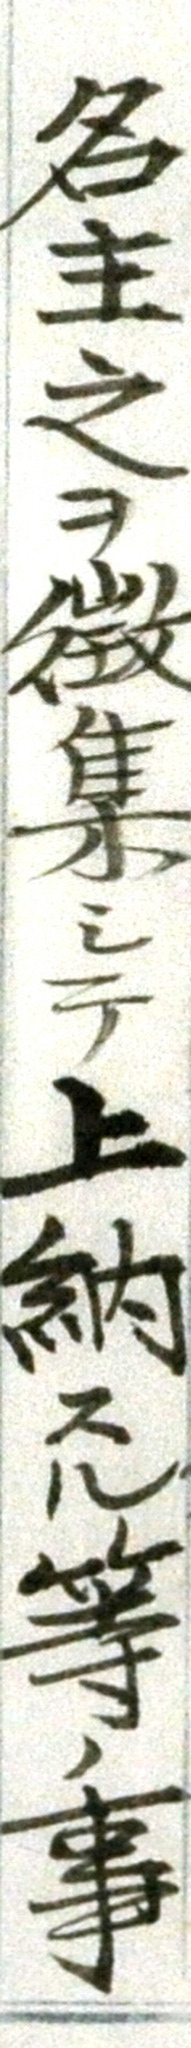名主之ヲ徴集シテ上納スル等ノ事
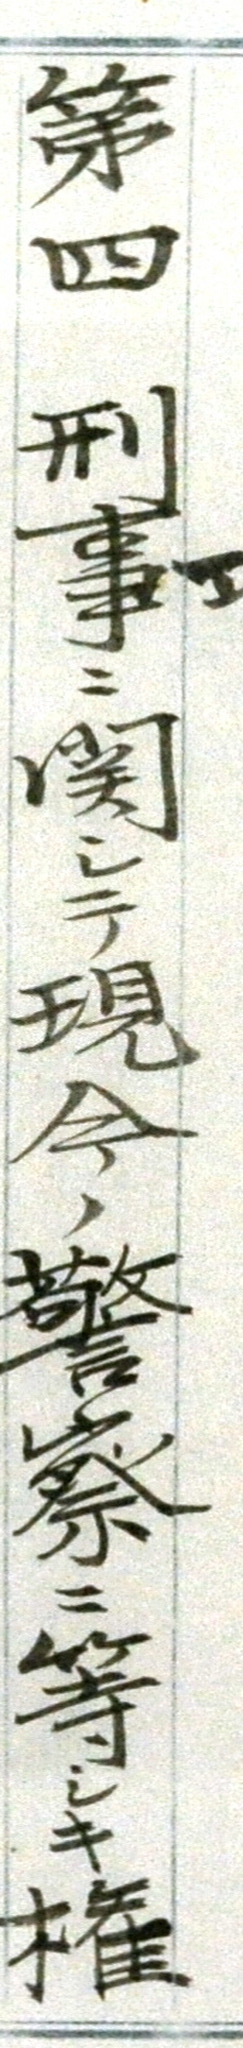第四刑事ニ関シテ現今ノ警察ニ等シキ権
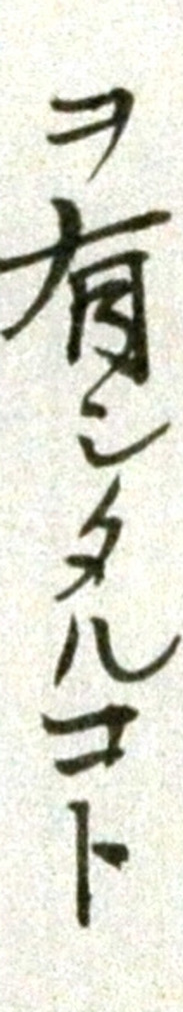ヲ有シタルコト
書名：村役人職掌大略
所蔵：伊那市立高遠町図書館・合同会社AMANE
